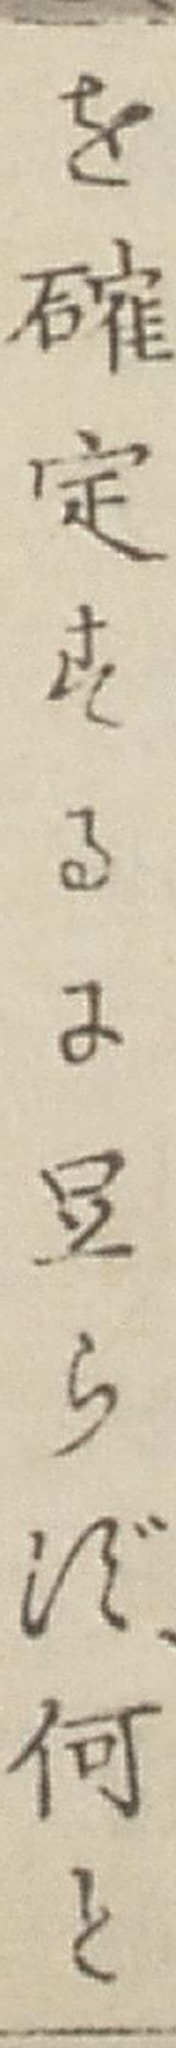を確定するに足らず、何と
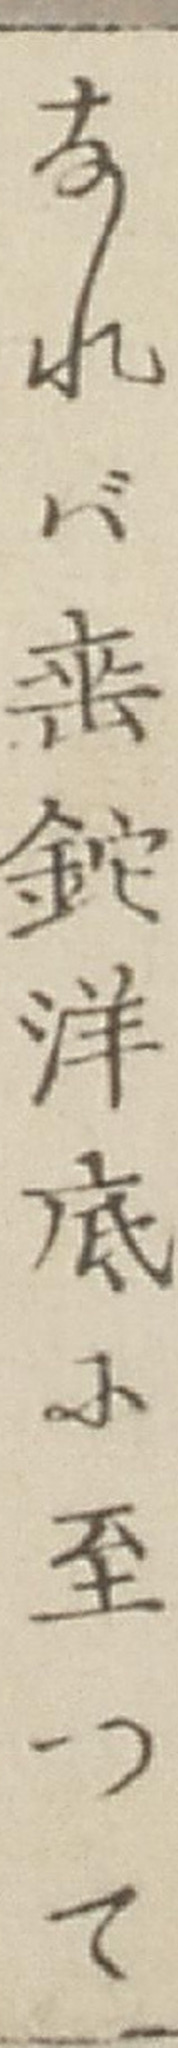なれば垂鉈洋底に至つて
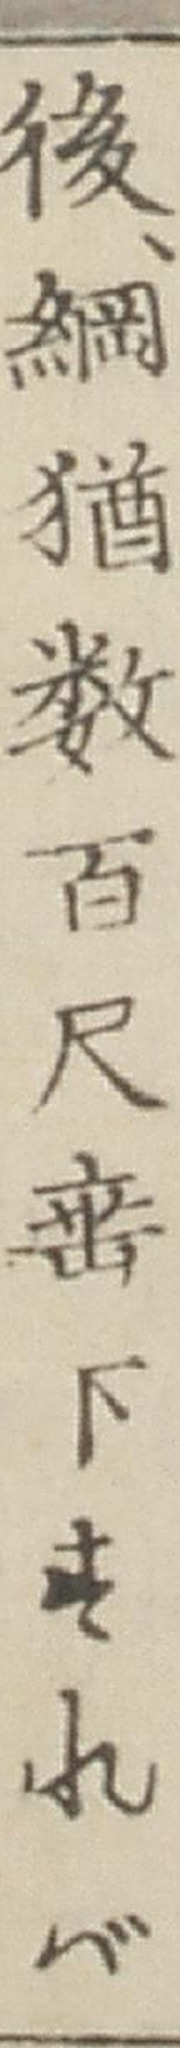後、綱猶数百尺垂下すれば
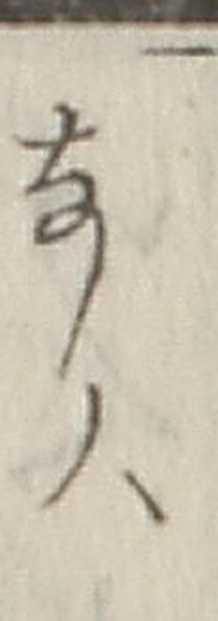なり、
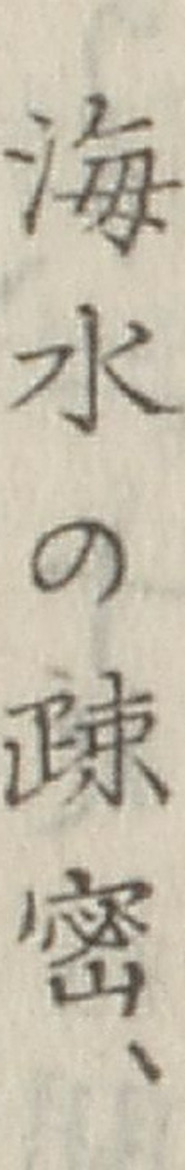海水の疎密、
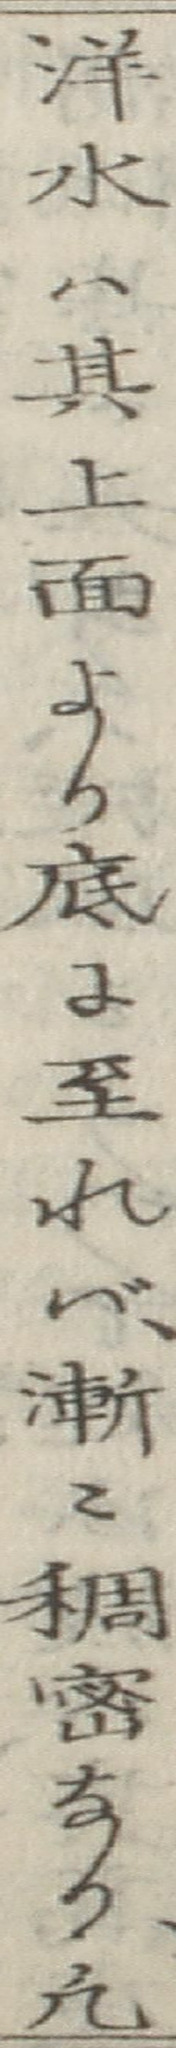洋水は其上面より底に至れば、漸々稠密なり、凡
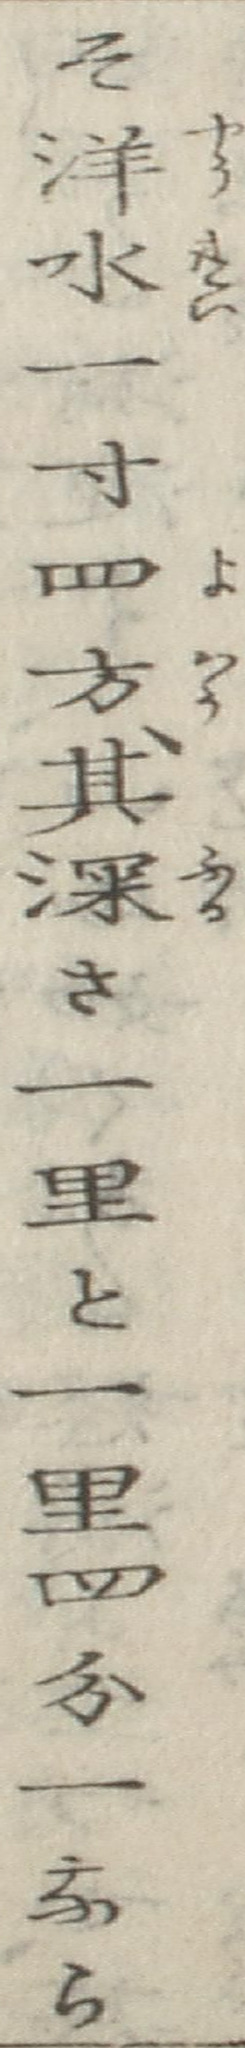そ洋水一寸四方、其深さ一里と一里四分一なら
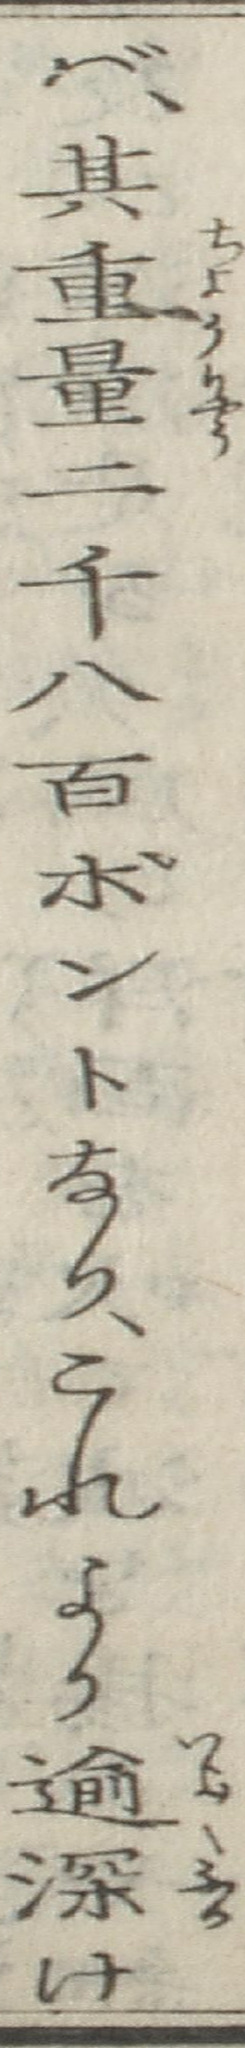ば、其重量二千八百ポントなり、これより逾深け
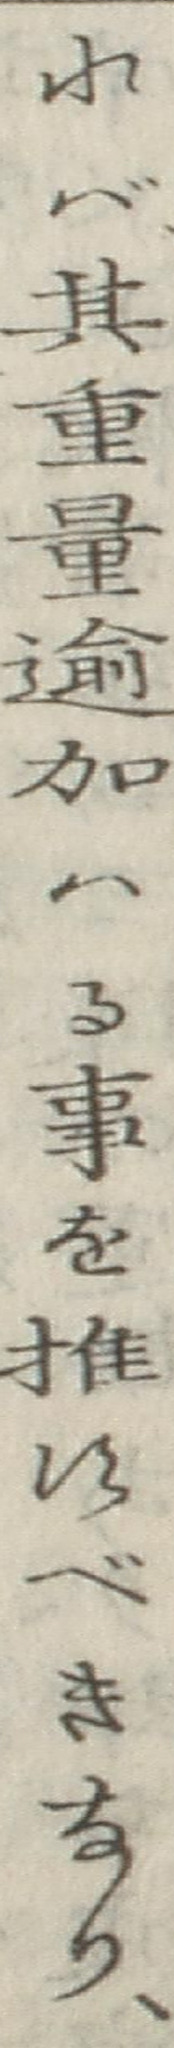れば、其重量逾加はる事を推すべきなり、
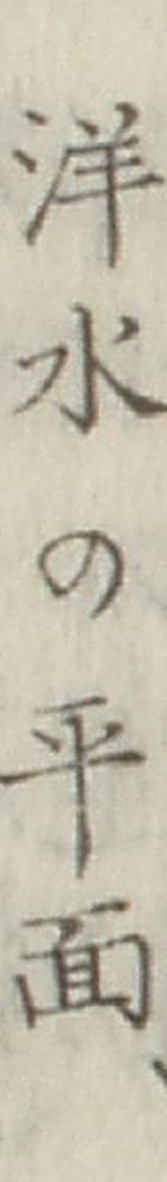洋水の平面、
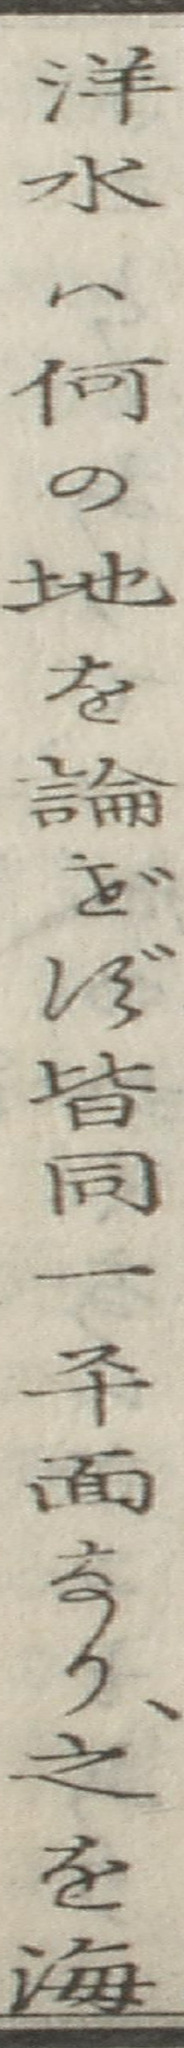洋水は何の地を論ぜず、皆同一平面なり、之を海
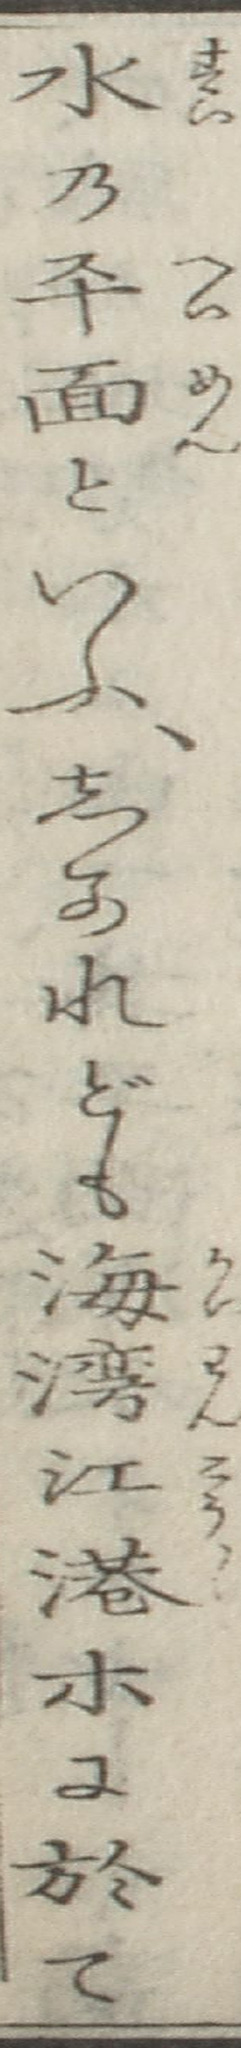水の平面といふ、しかれども海湾江港等に於て

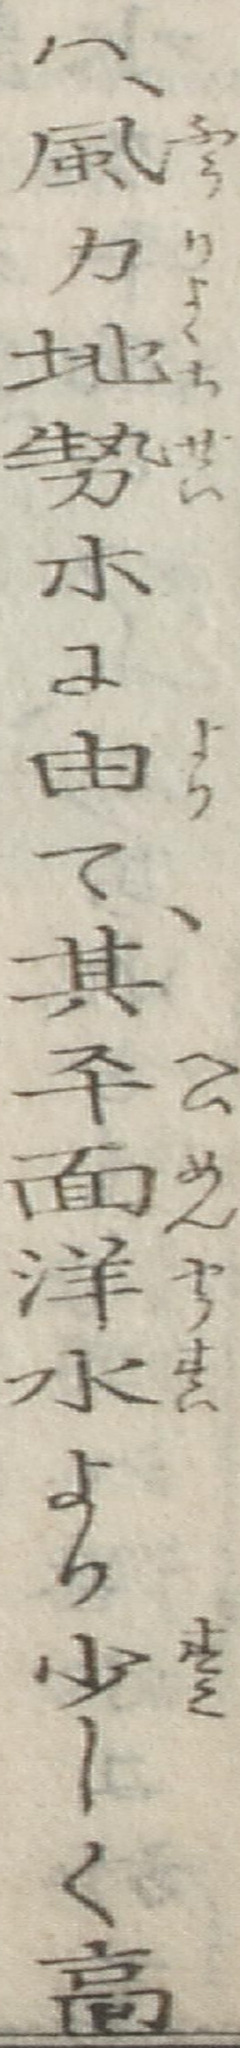は、風力地勢等に由て、其平面洋水より少しく高
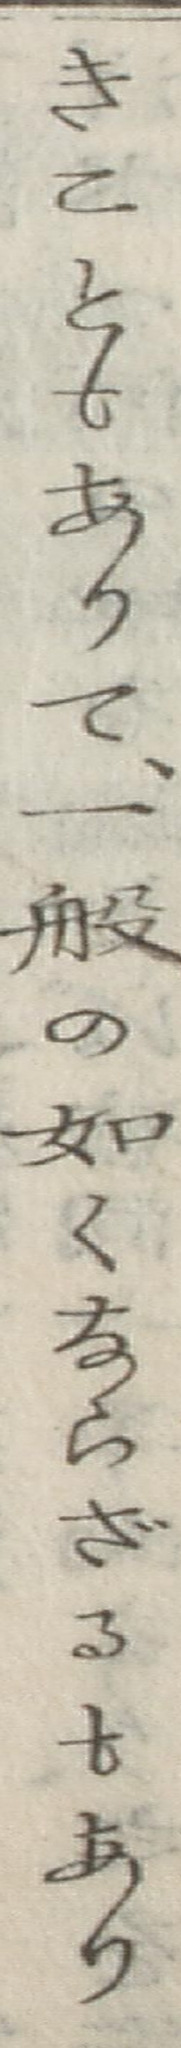きこともありて、一般の如くならざるもあり
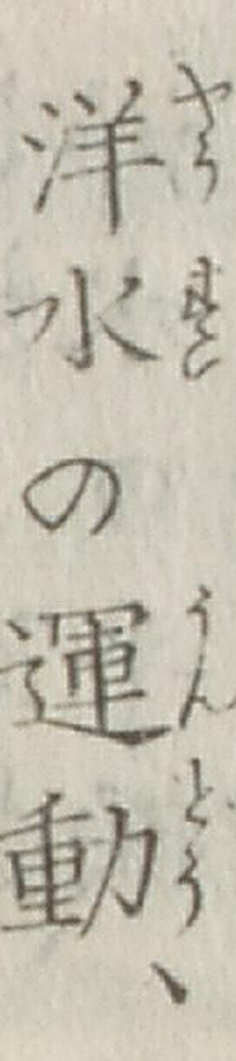洋水の運動、
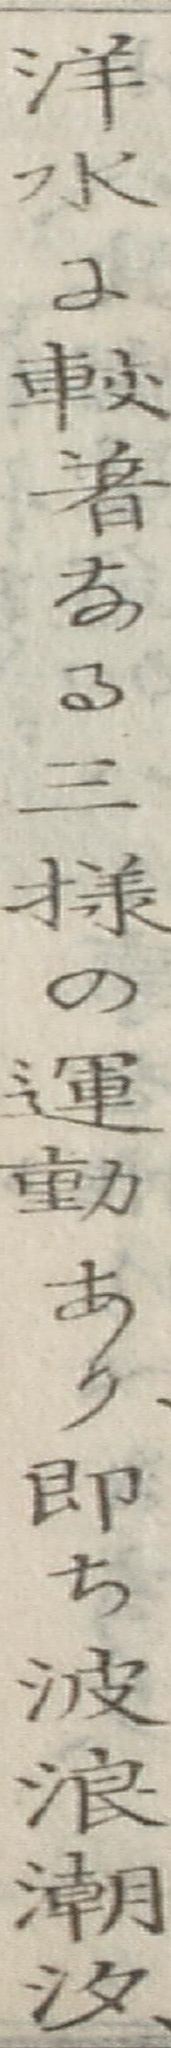洋水に較著なる三様の運動あり、即ち波浪、潮汐、
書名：訓蒙　天然地理學　中
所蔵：東京大学地震研究所図書室 Earthquake Research Institute Library, The University of Tokyo, JAPAN
